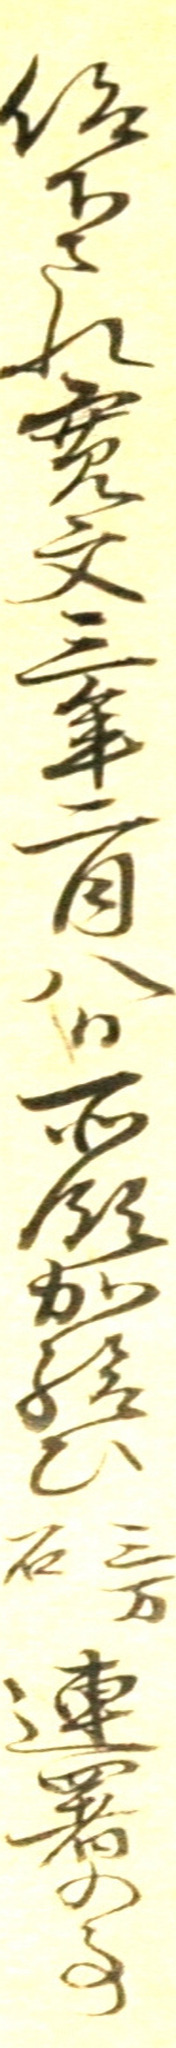仰下され寛文三年二月八日所領加給ひ三万石連署の事

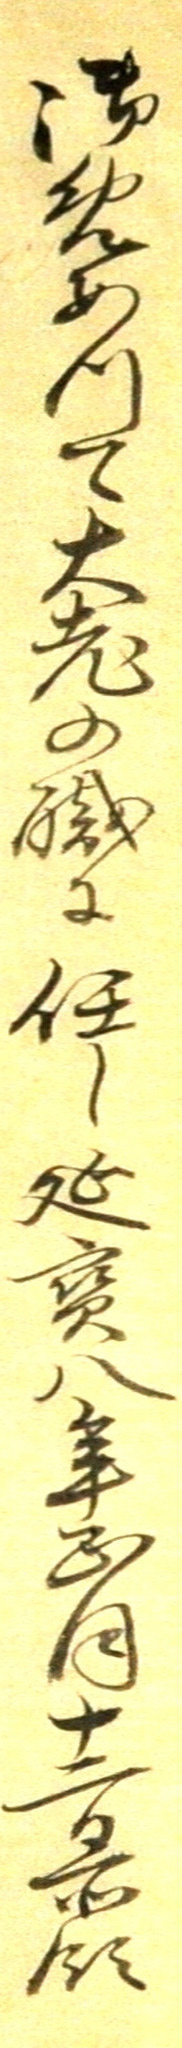御免あつて大老の職に任し延宝八年正月十二日所領
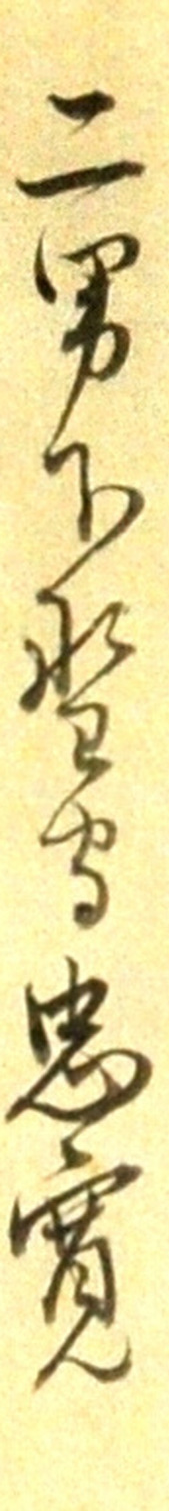二男下野守忠寛
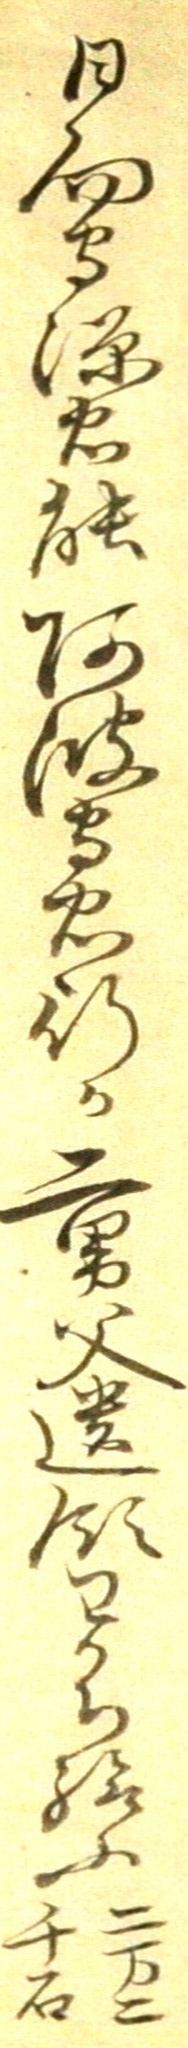日向守源忠能阿波守忠行か二男父遺領わかち給ふ二万二千石
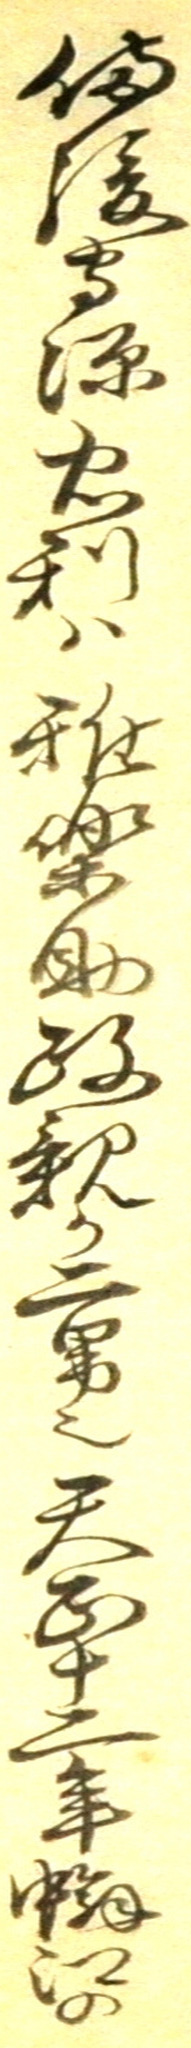備後守源忠利は雅楽助正親か二男也天正十二年蟹江の
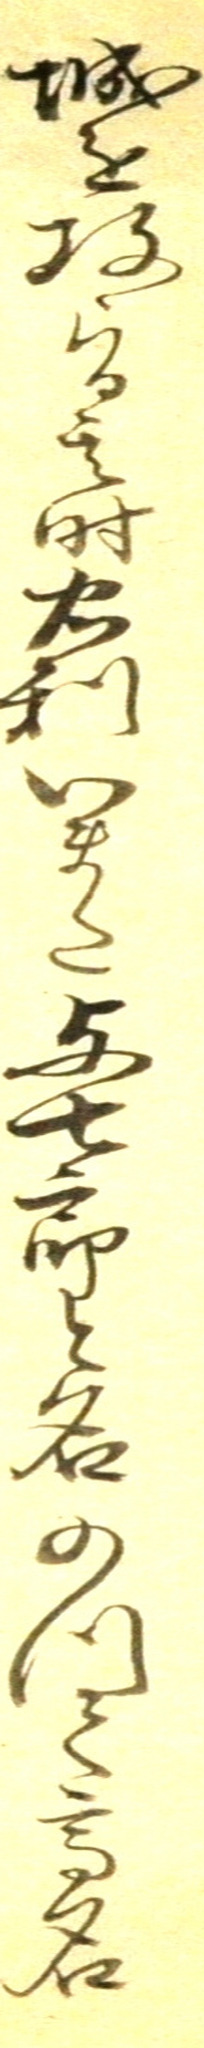城を攻らる其時忠利いまた与七郎と名のつて高名
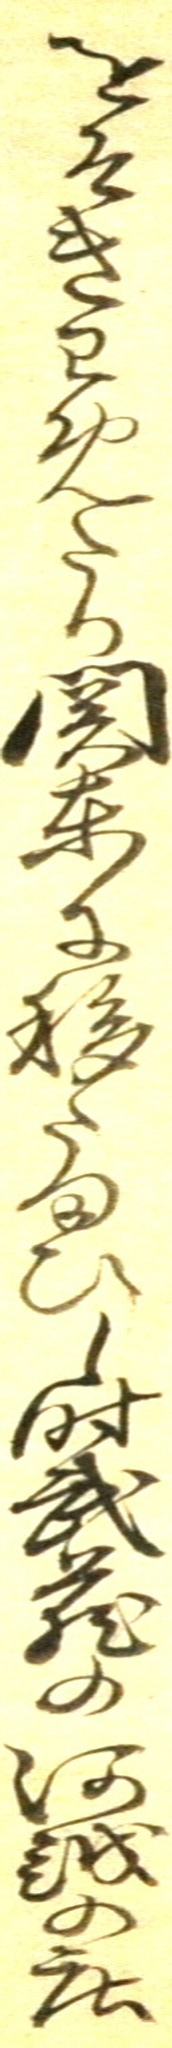をそきわめたり関東に移たまひし時武蔵の河越の庄
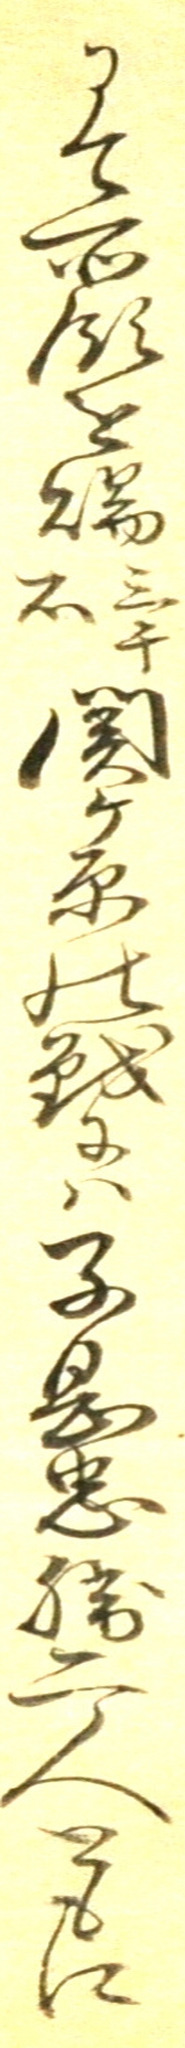にて所領を賜三千石関ヶ原の戦には子息忠勝二人ともに
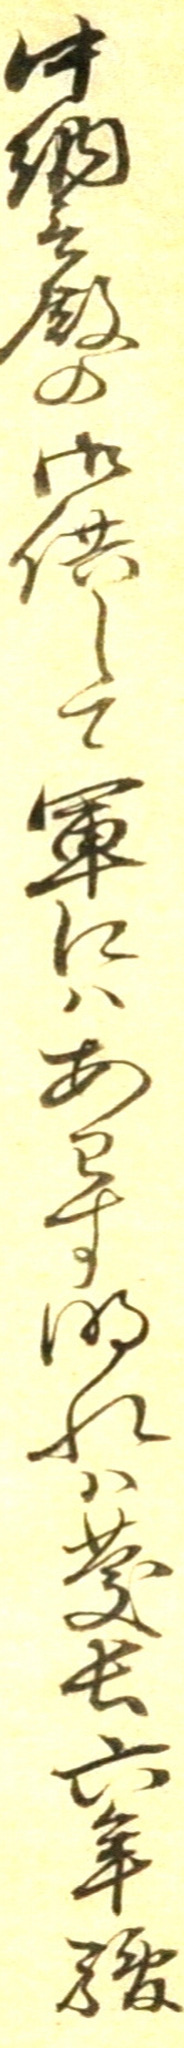中納言殿の御供して軍にはあわす明れは慶長六年駿
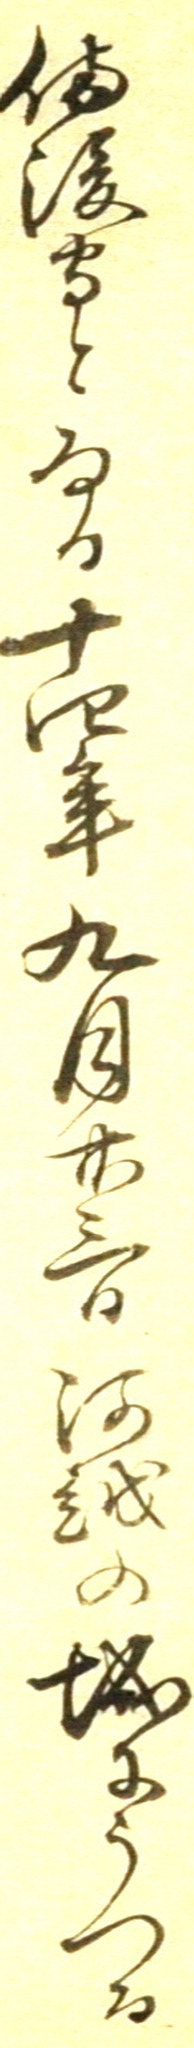備後守となる十四年九月廿三日河越の城にうつる
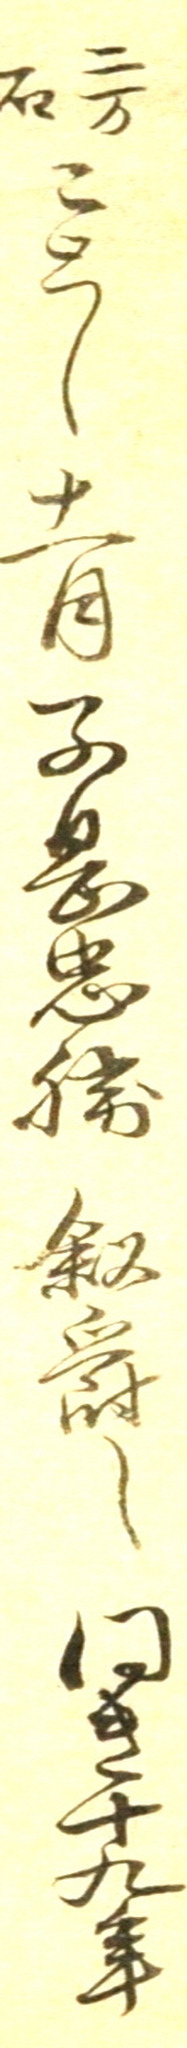二万石ことし十一月子息忠勝叙爵し同き十九年
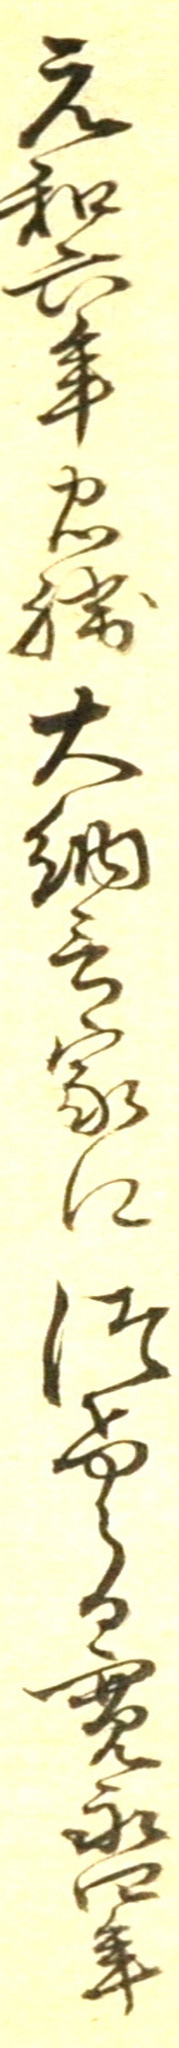元和六年忠勝大納言家につけらる寛永四年

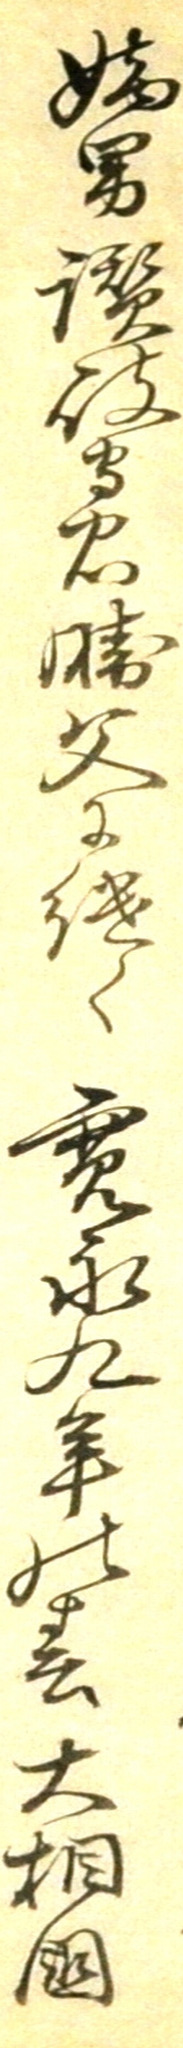嫡男讃岐守忠勝父に継く寛永九年の春大相国
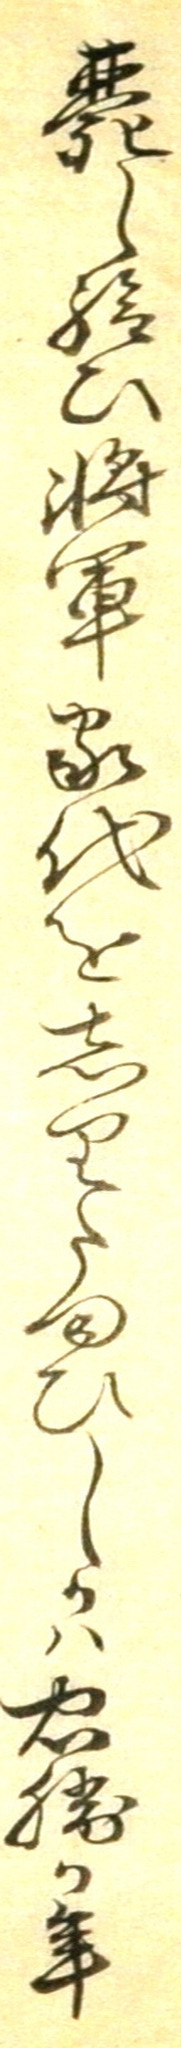薨し給ひ将軍家代をしりたまひしかは忠勝か年
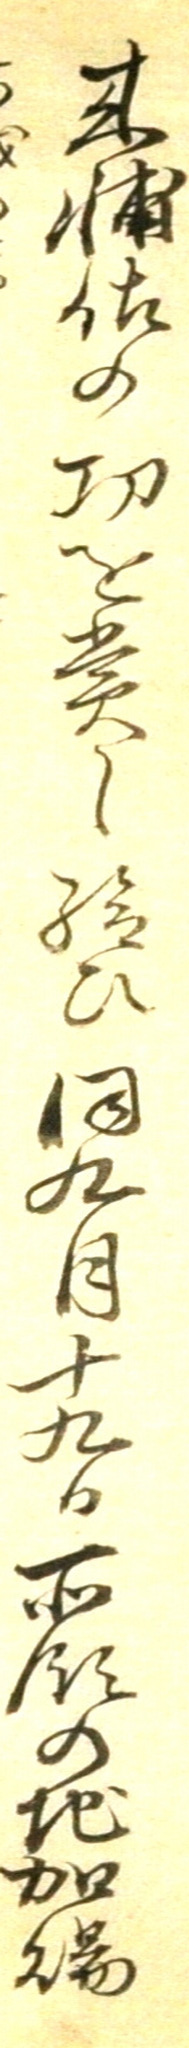来輔佐の功を賞し給ひ同九月十九日所領の地加賜
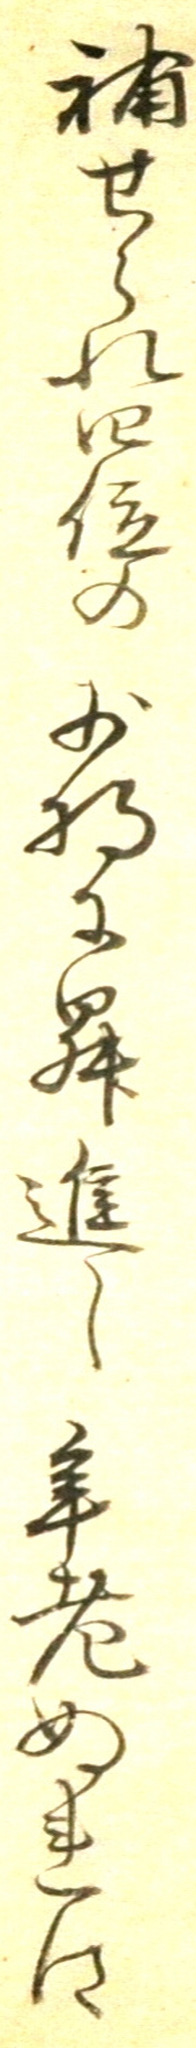補せられ四位の少将に昇進し年老ぬれは
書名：藩翰譜（五）
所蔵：伊那市立高遠町図書館・合同会社AMANE
